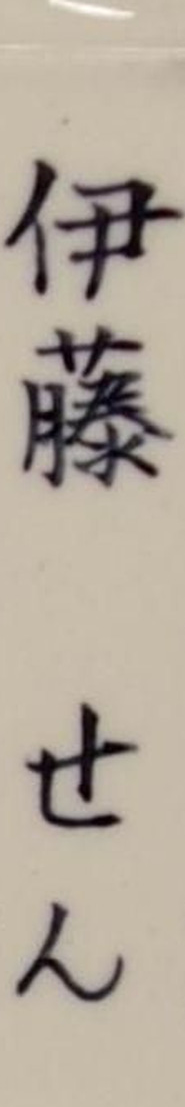伊藤せん
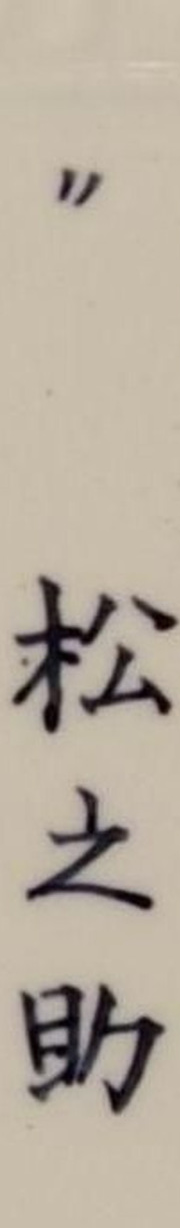松之助
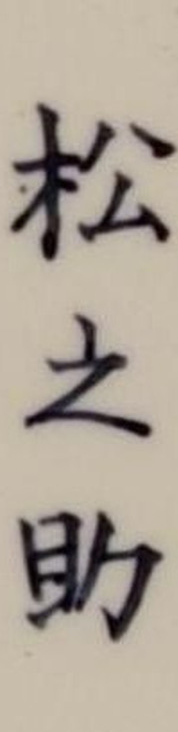松之助
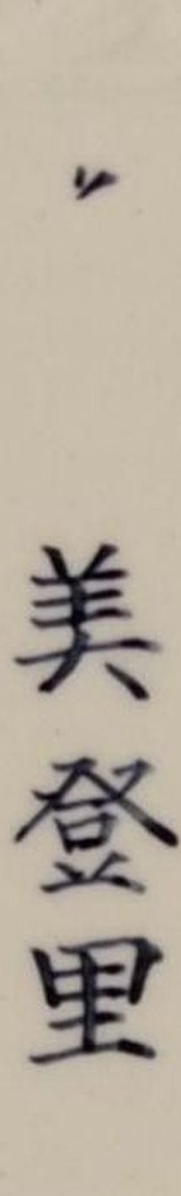美登里
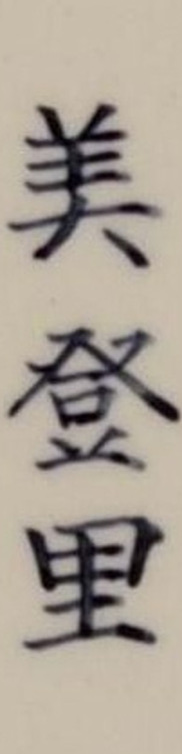美登里
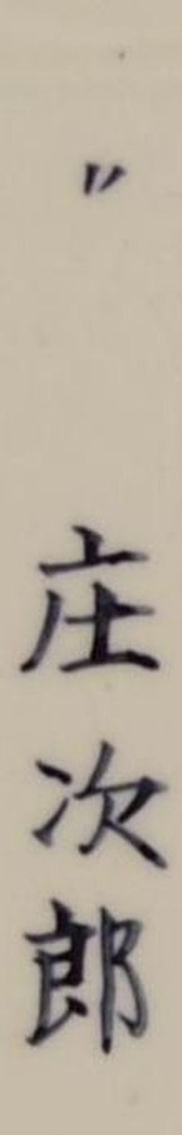庄次郎
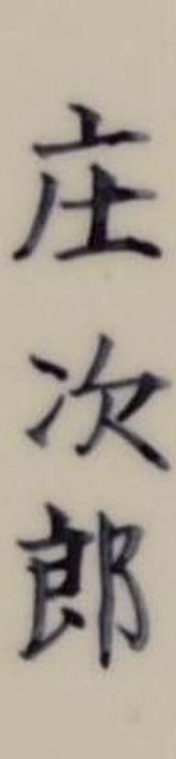庄次郎
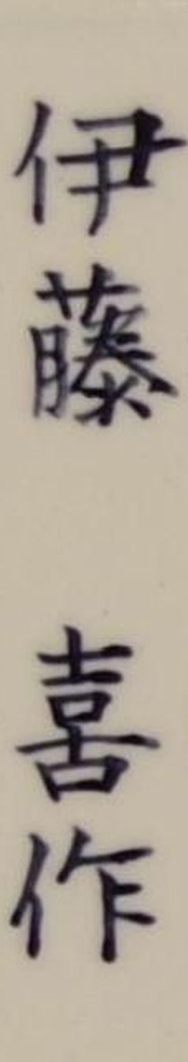伊藤喜作
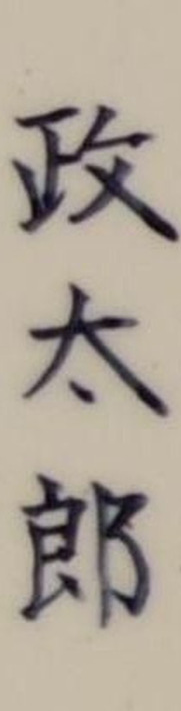政太郎

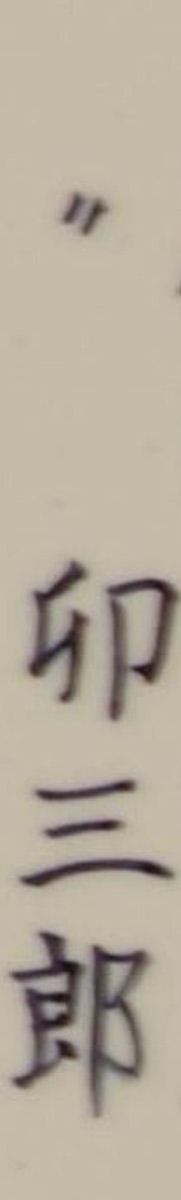卯三郎
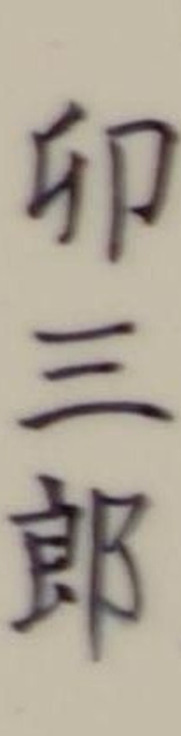卯三郎
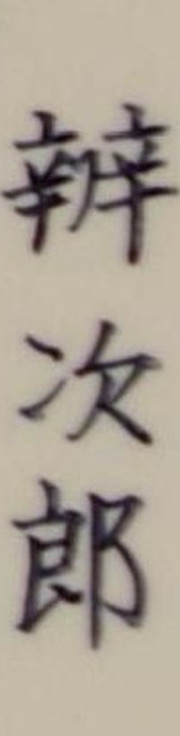辨次郎
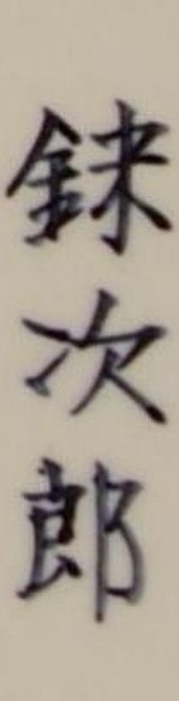辨次郎
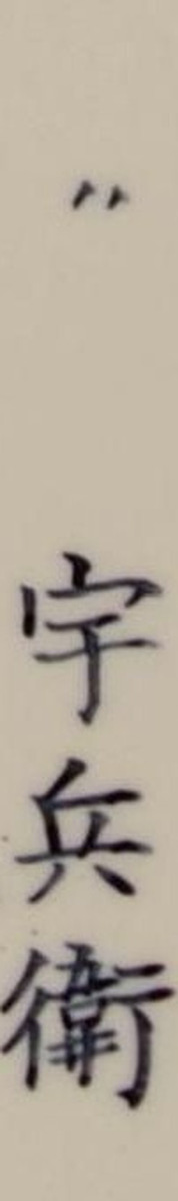宇兵衛
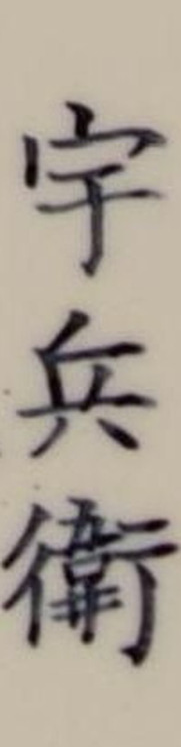宇兵衛
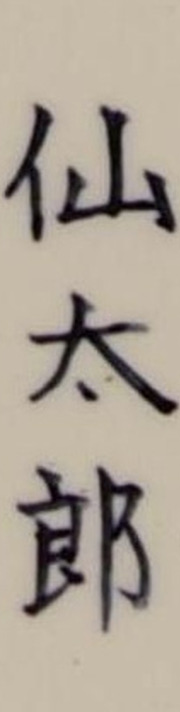仙太郎
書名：M~S
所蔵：高野山金剛峯寺
